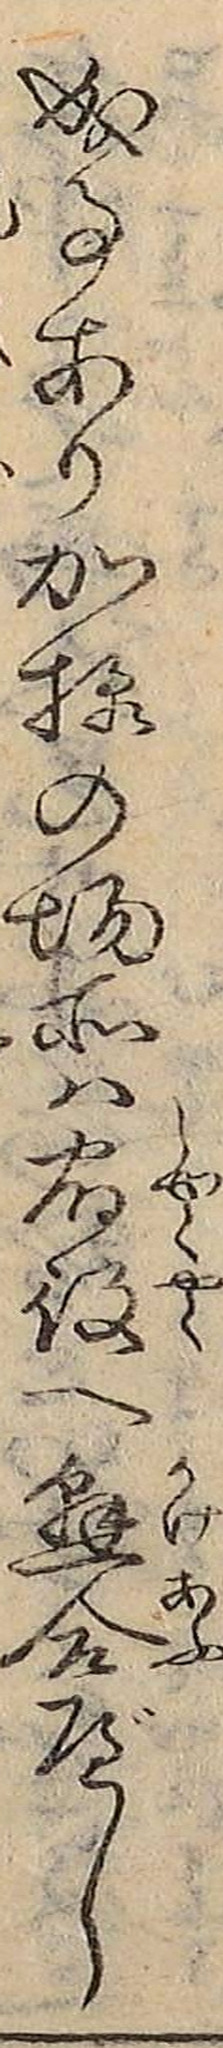成事ありか様の場所は宿役へ懸合べし
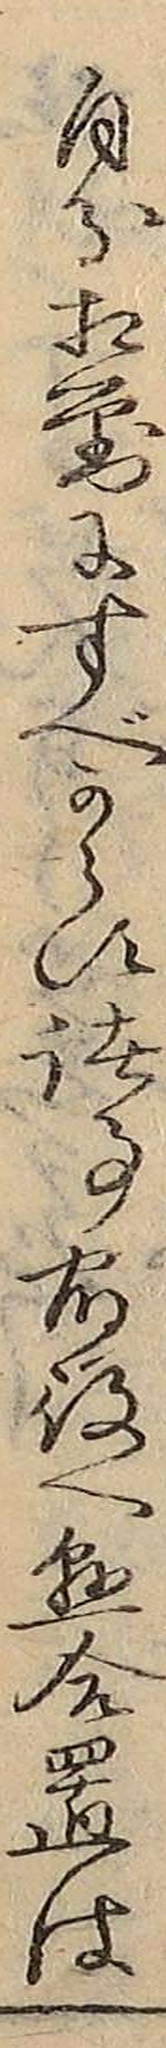自分相対にすべからす諸事宿役へ懸合置は
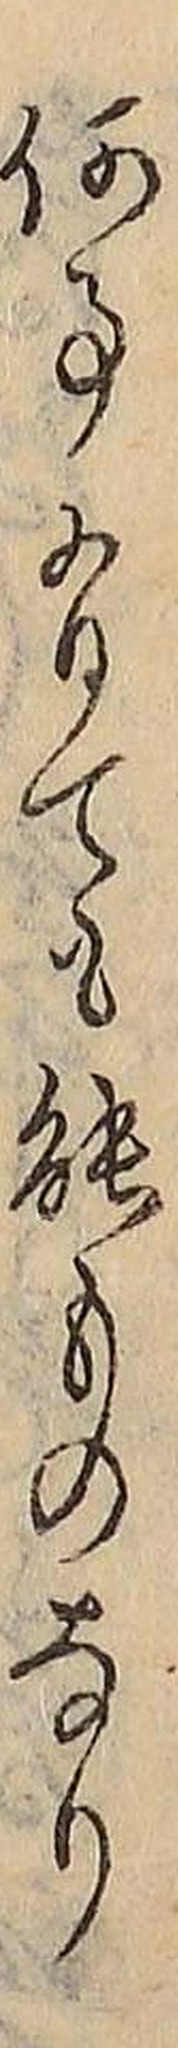何事に有ても能ものなり
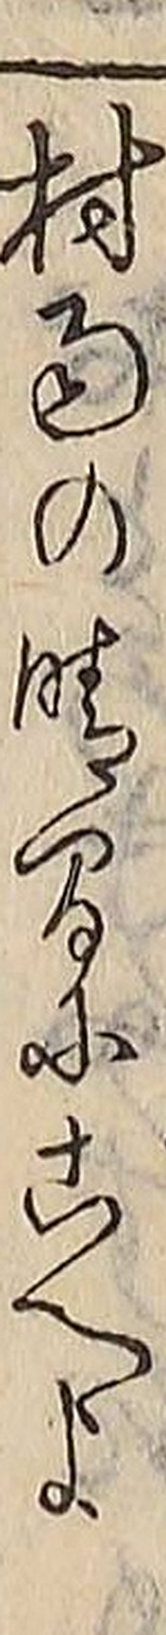村雨の晴間にこへよ
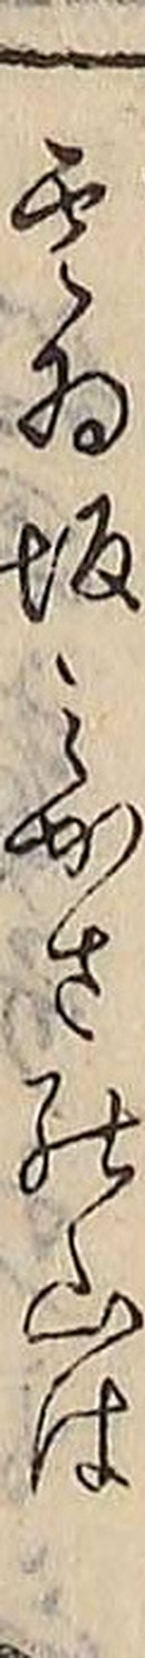雲ゐ坂みかさの山は
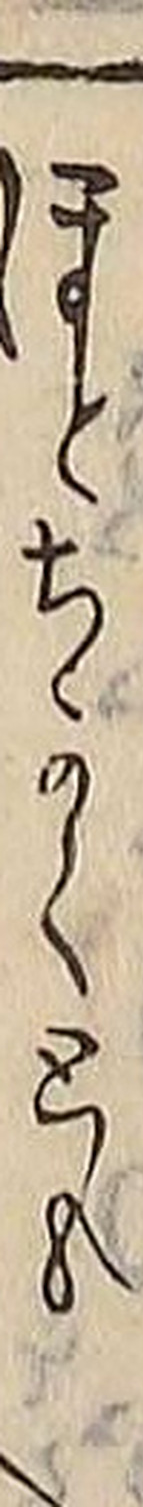ほとちかくとも
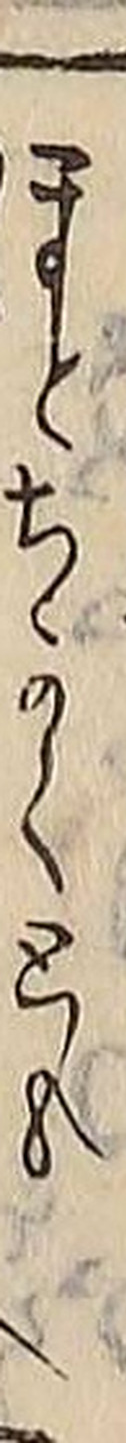ほとちかくとも

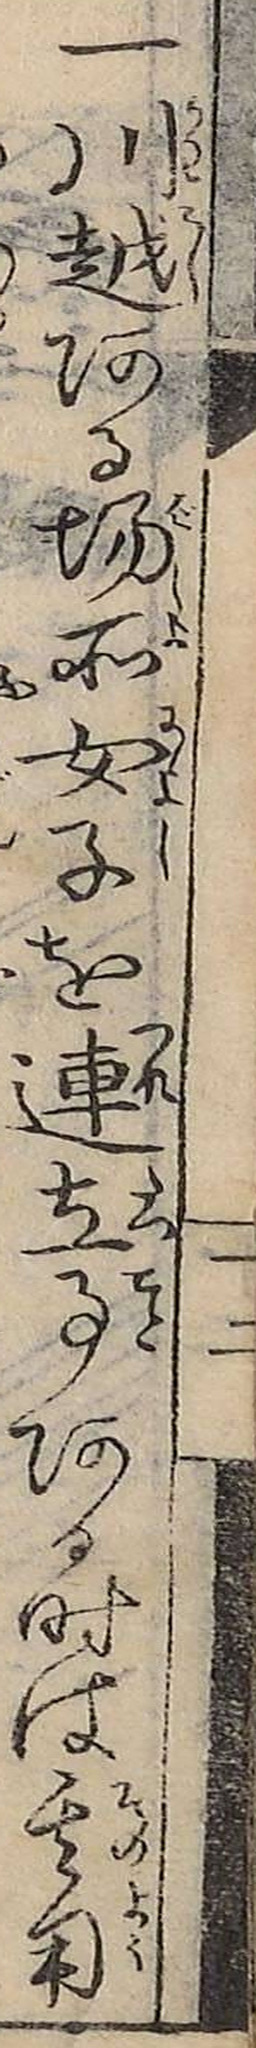一川越ある場所女子を連立事ある時は其用
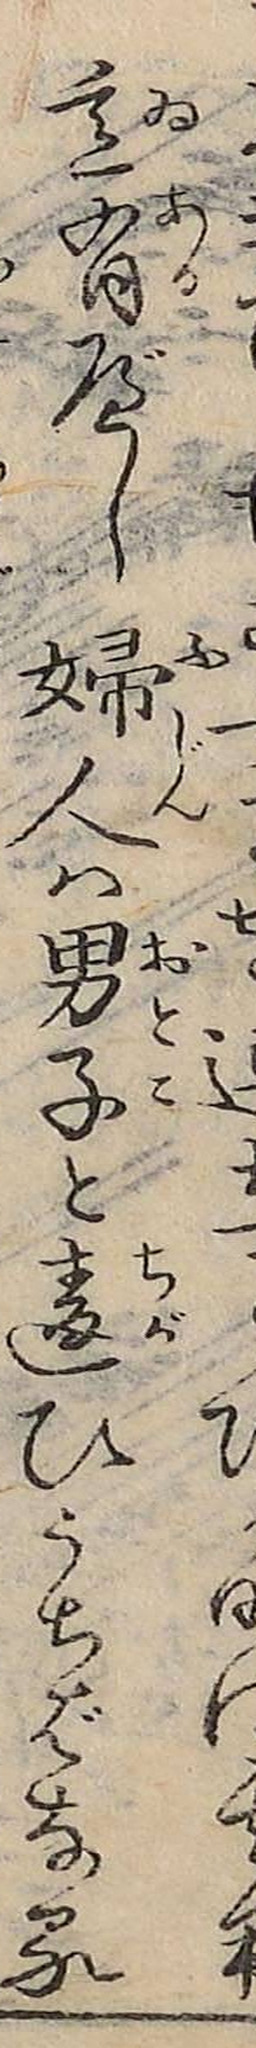意有べし婦人は男子と違ひうちばなる
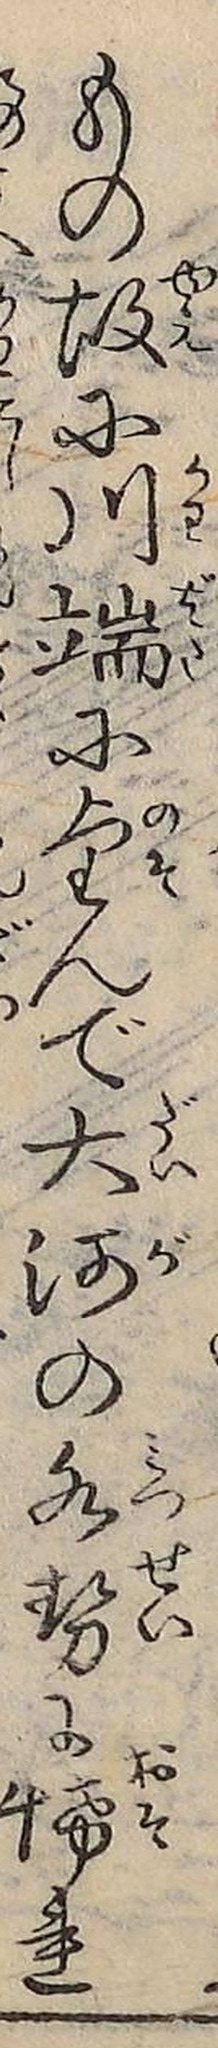もの故に川端に望んで大河の水勢に怖れ
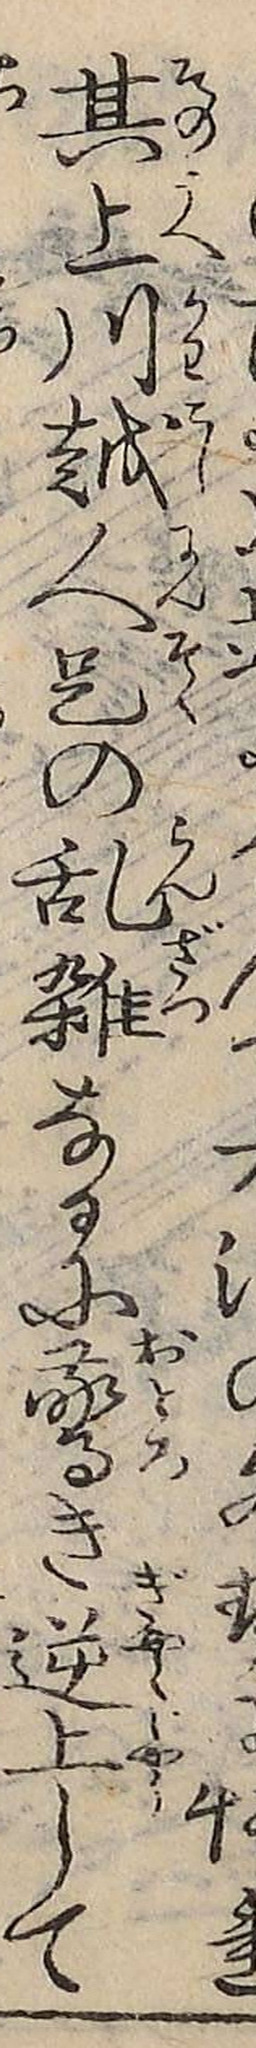其上川越人足の乱雑なるに驚き逆上して
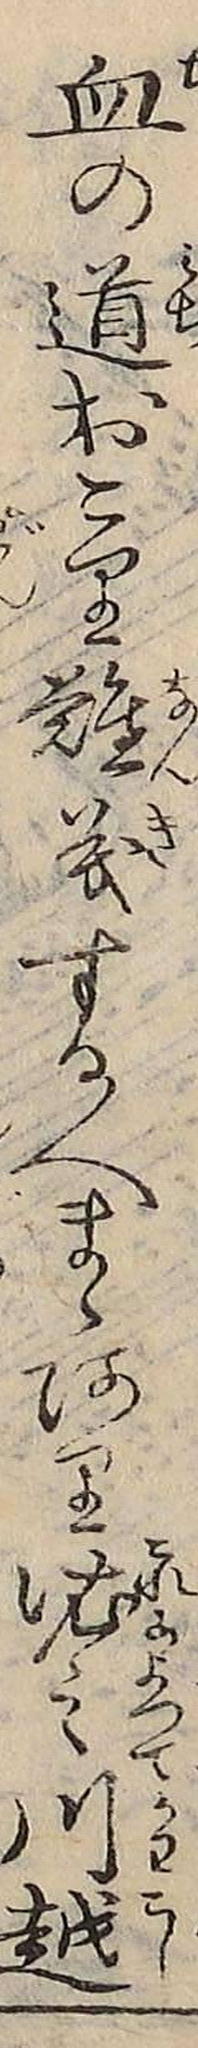血の道おこり難義する人まゝあり依之川越
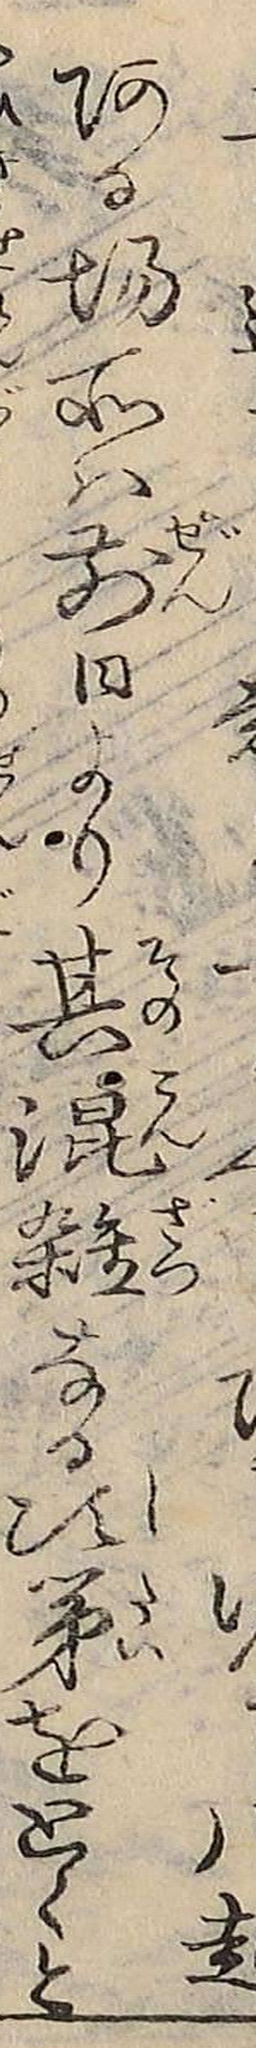ある場所は前日より其混雑なる次第をとくと
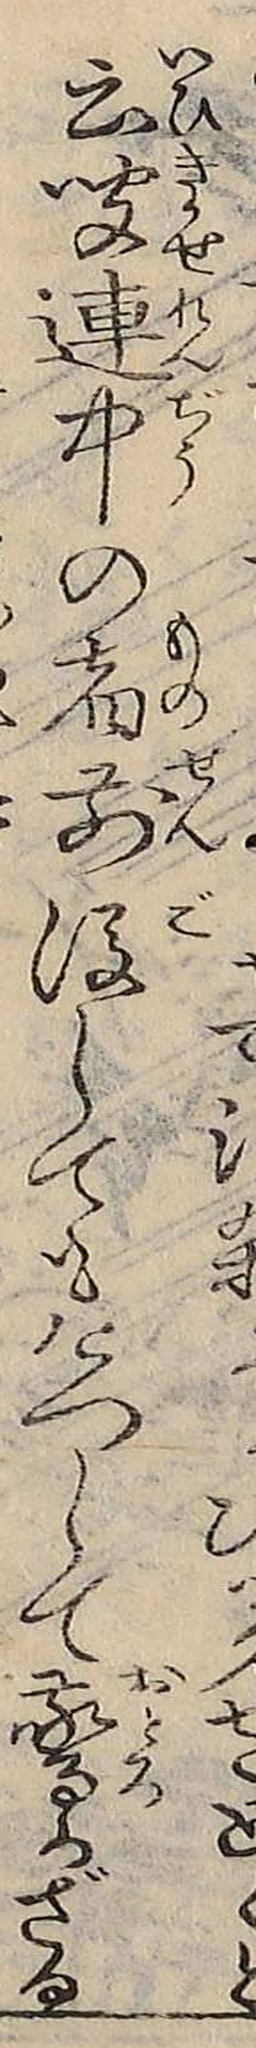云聞連中の者前後してもけつして驚かざる
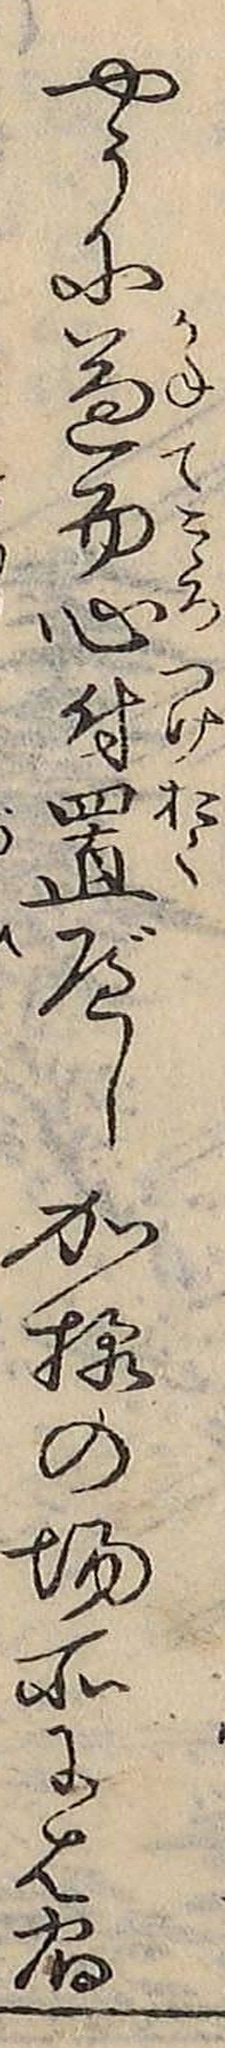やうに兼而心付置べしか様の場所には宿
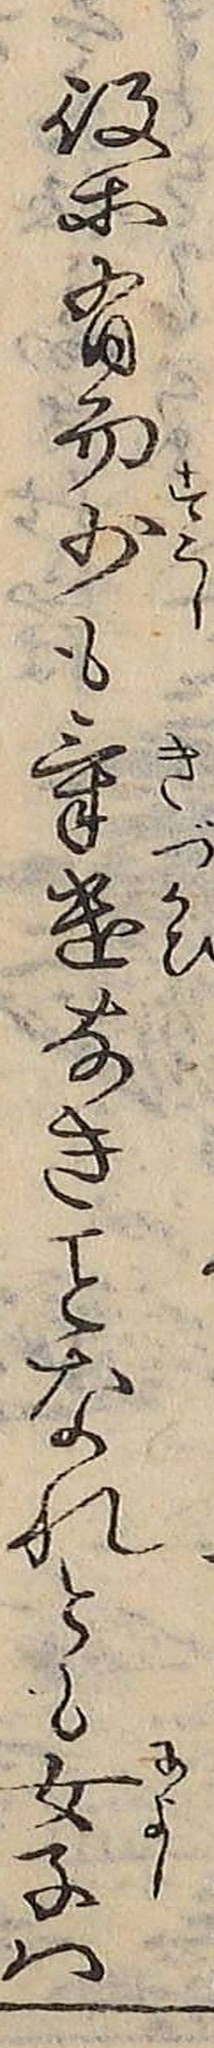役等有而少も気遣なきことなれとも女子は
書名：旅行用心集
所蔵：神戸大学附属図書館 国文学研究資料館
